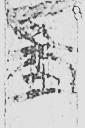市
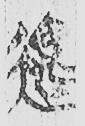遇
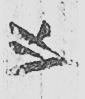之
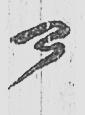乃
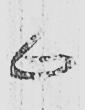㠯（以）
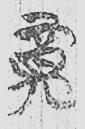奠
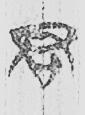君
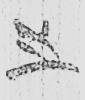之
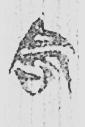命
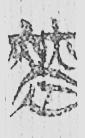{炎衣}
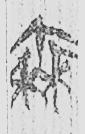秦
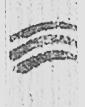三
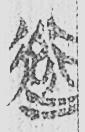{行幺止}
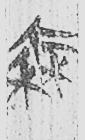秦
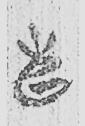{山𡴎}
